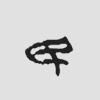民
